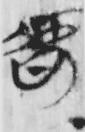唬
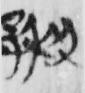○（梁）
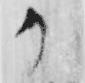人
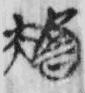○（胡）
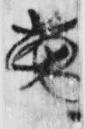慶
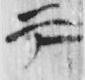下
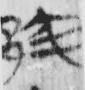○（蔡）
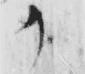人
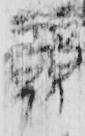競
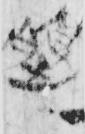○（履）
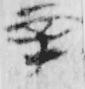辛
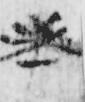未
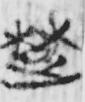楚
